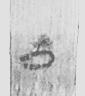四
